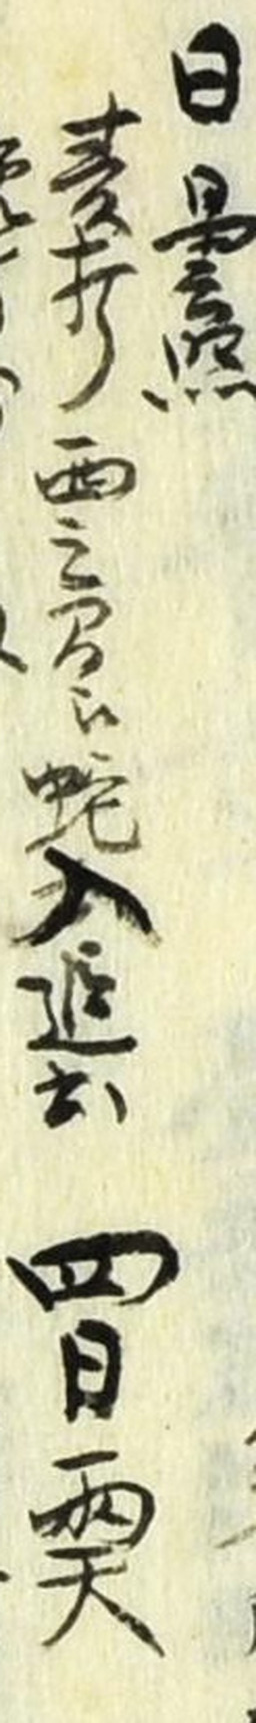麦打西之間江蛇入追出四日雨天
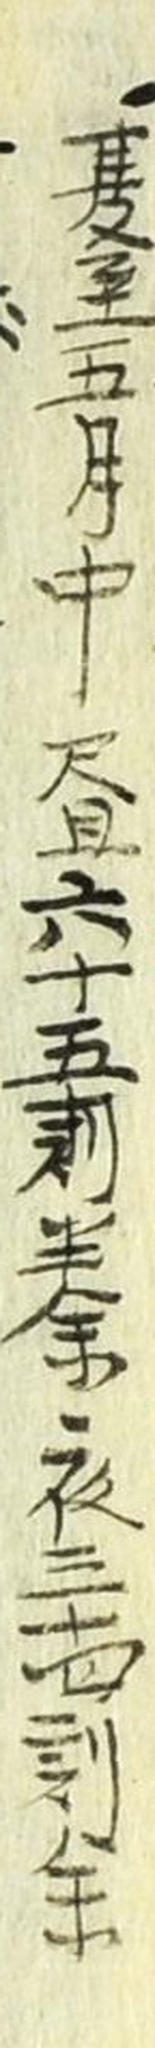夏至五月中昼六十五刻半余夜三十四刻余
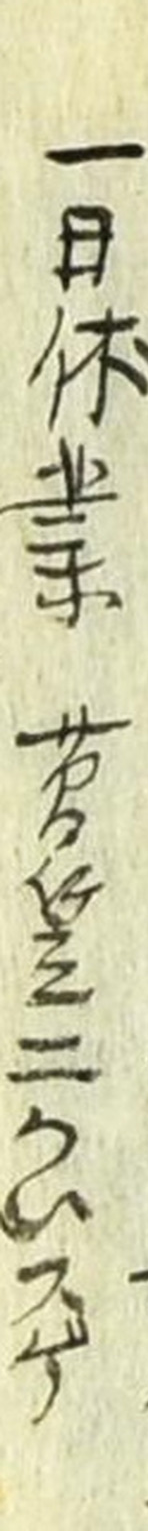一日休業菅笠二かいスゲ
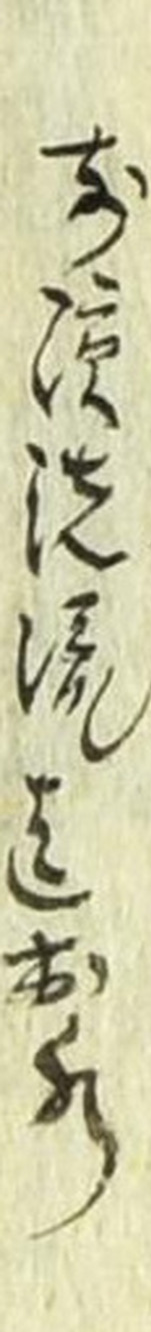前浜洗流迄出水
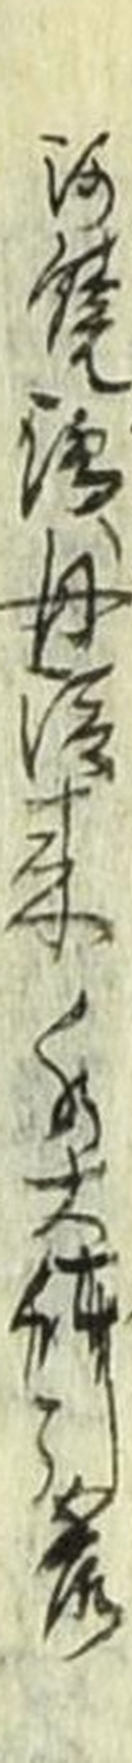河饒島へ船後来水大体引落
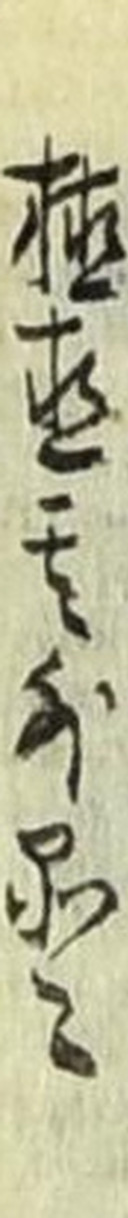植直其外品々
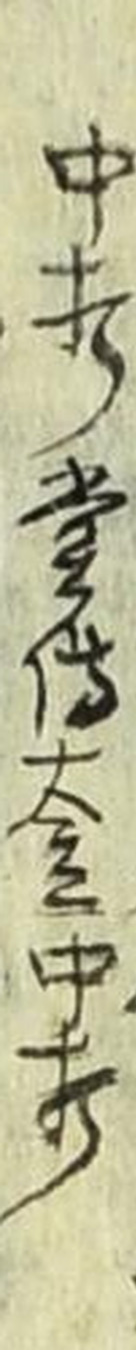中打堂伝大豆中打
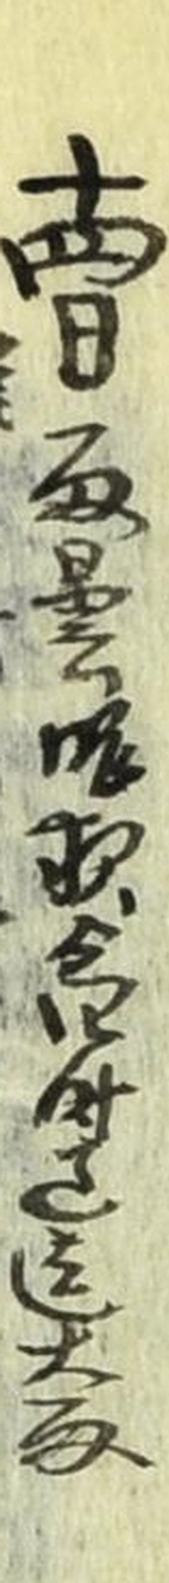十四日雨曇晴夜ゟ四時過迄大雨
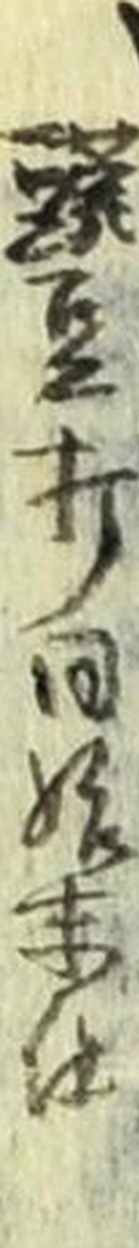豌豆打同始末仕
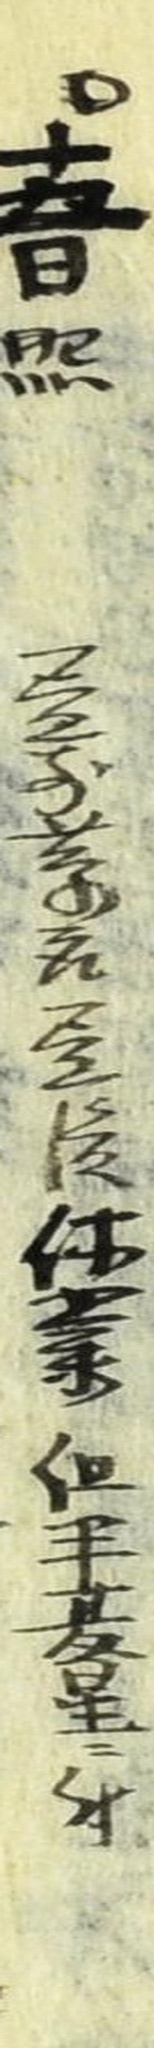○十五日照昼前草取昼後休業但夏星ニ付
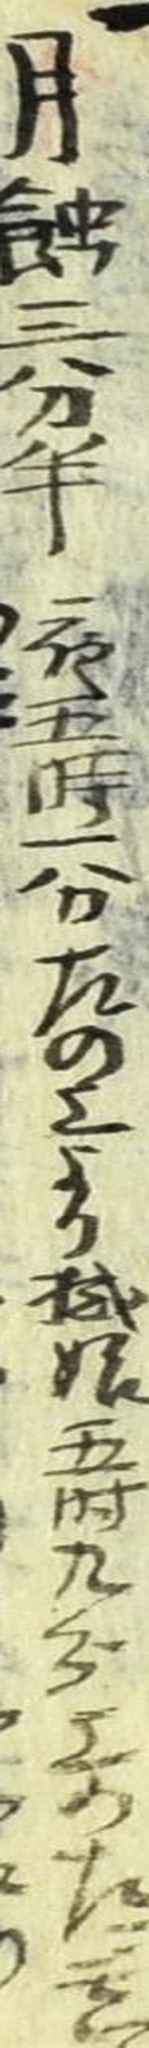月蝕三分半夜五時一分左の上より掛始五時九分上の左ニ玄し
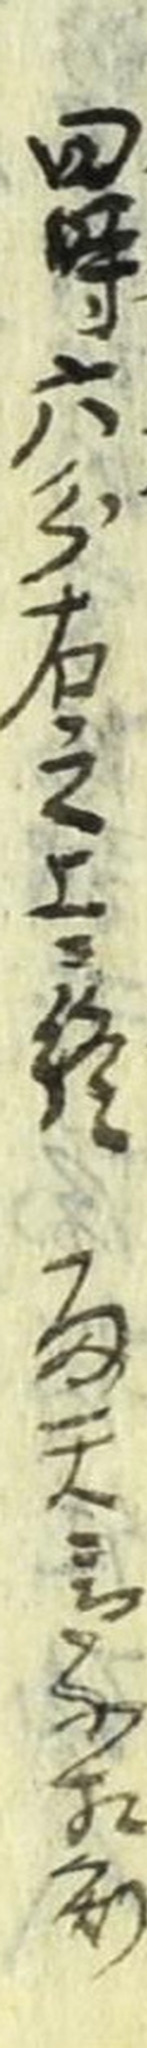四時六分右之上ニ終雨天ニ而不相知
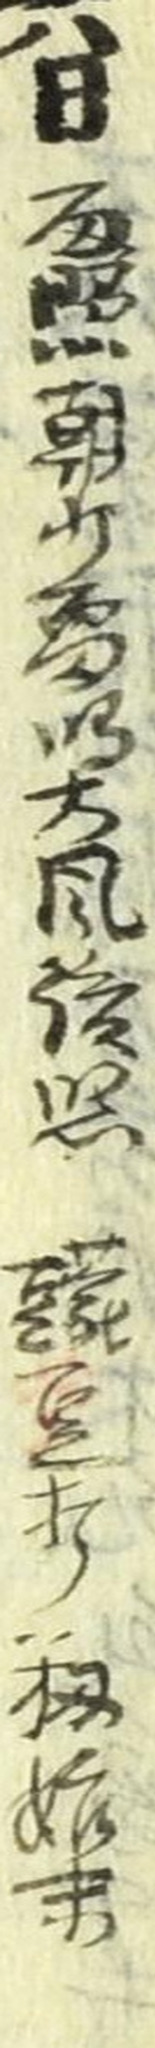十六日雨照朝少雷鳴大風後照豌豆打籾始末
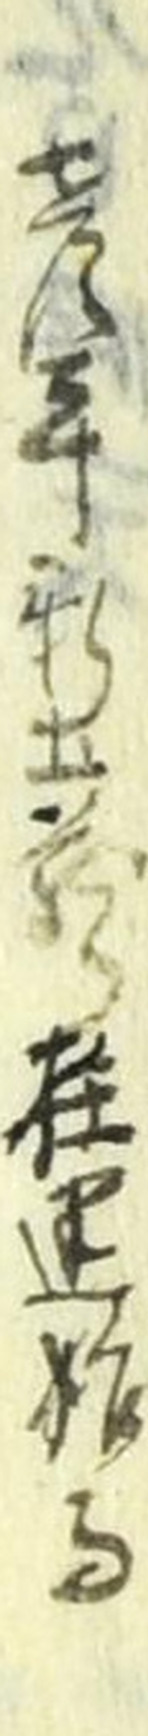彦平新土蔵柱建始る

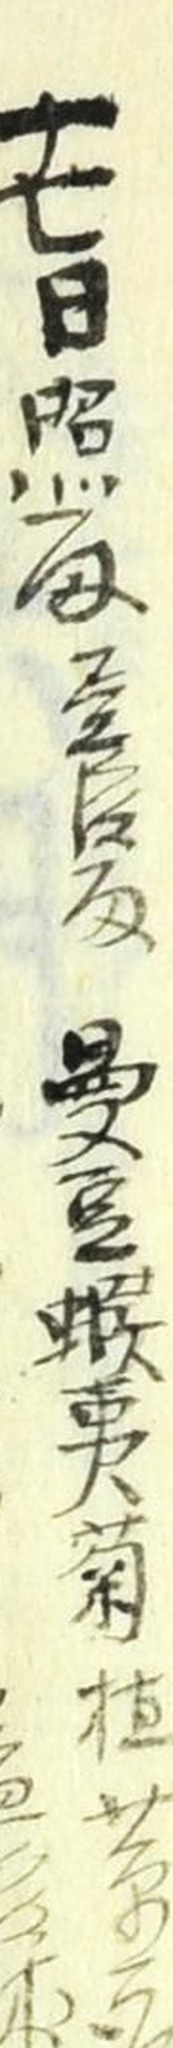十七日照昼後雨曼豆蝦夷菊植草取
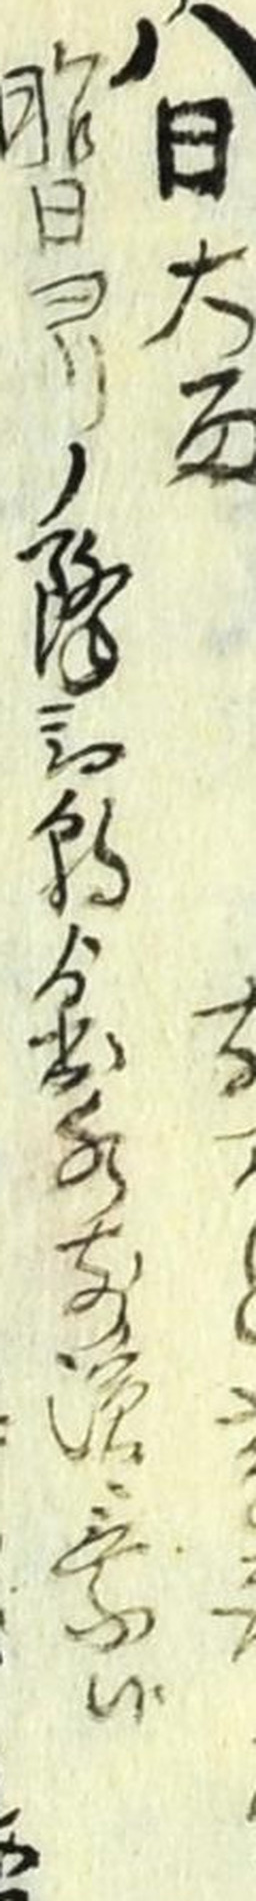昨日ヨリノ降ニ而朝ゟ出水前浜へ乗候
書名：（日記）
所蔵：福井県文書館 Fukui Prefectural Archives
